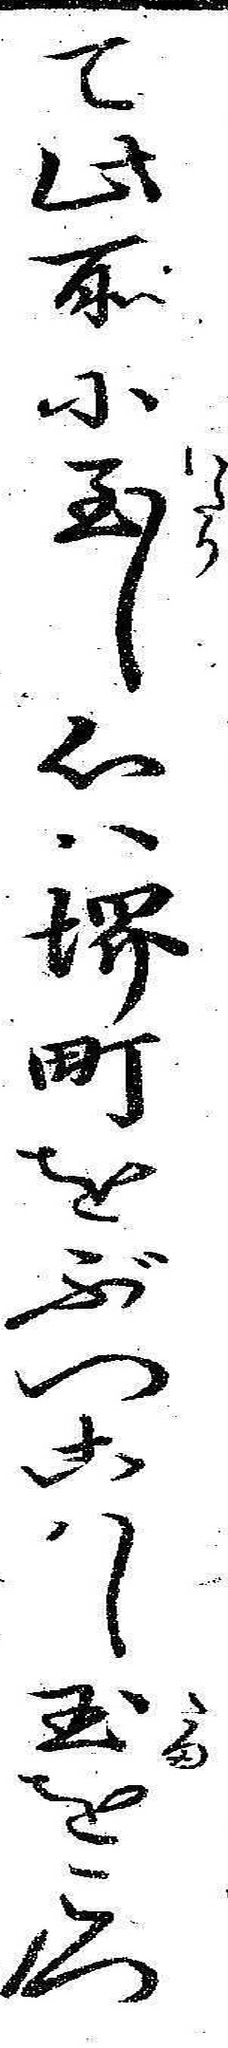て此所に至し心は堺町をぶつこはし玉をこつ
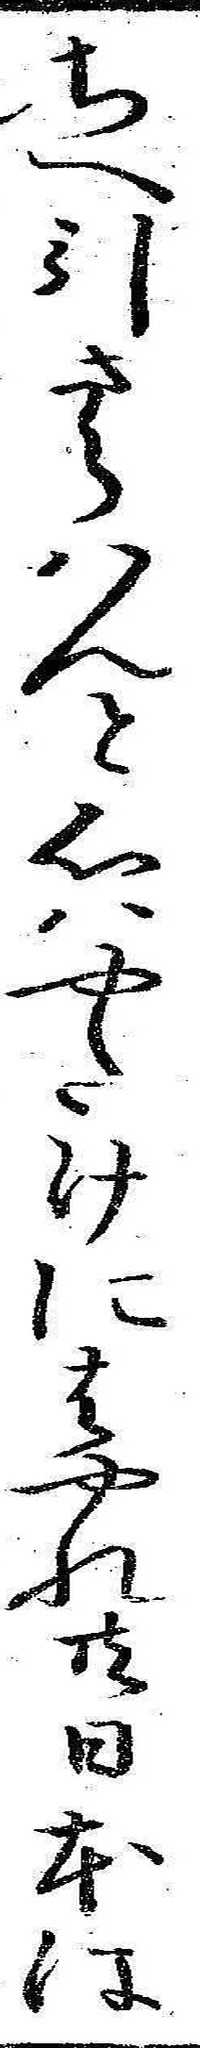ちへ引さらはんと心はやたけにはやれ共日本は
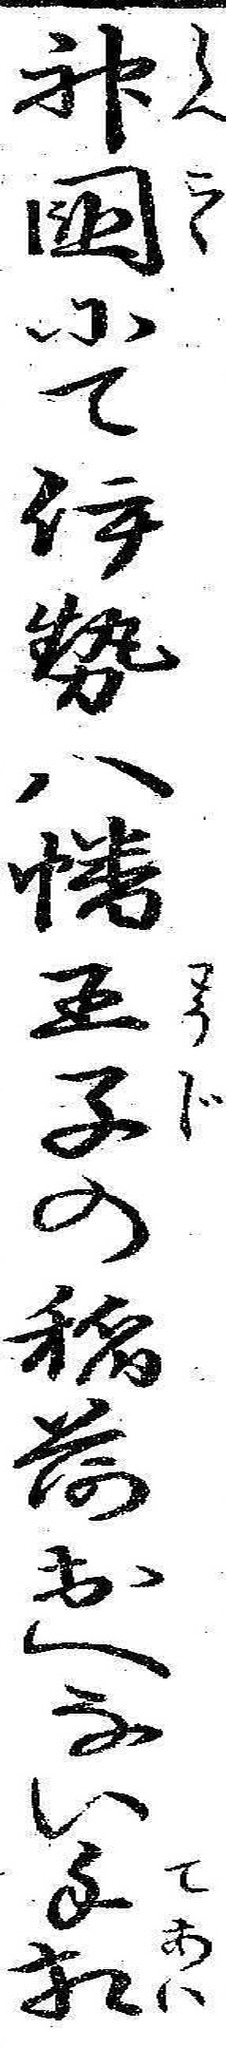神国にて伊勢八幡王子の稲荷おへない手相
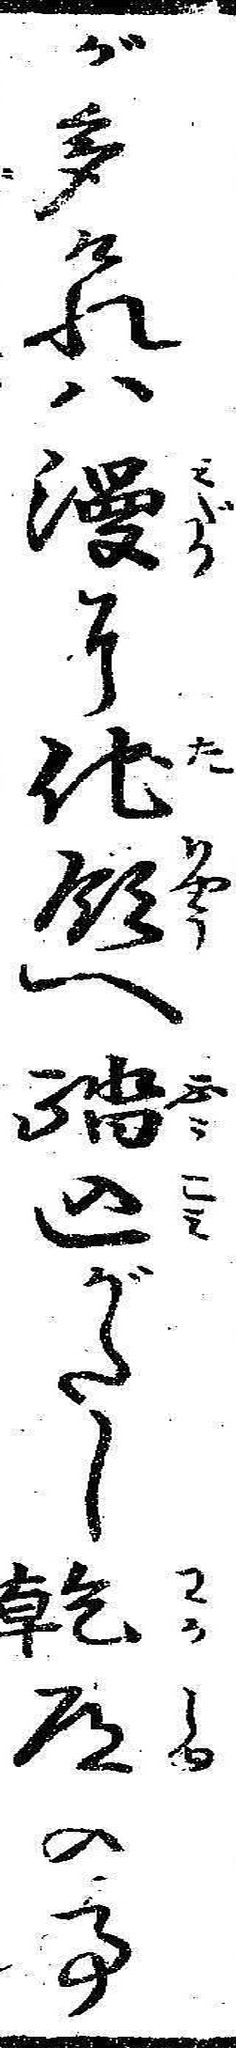が多けれは漫に他領へ踏込がたし乾道の事
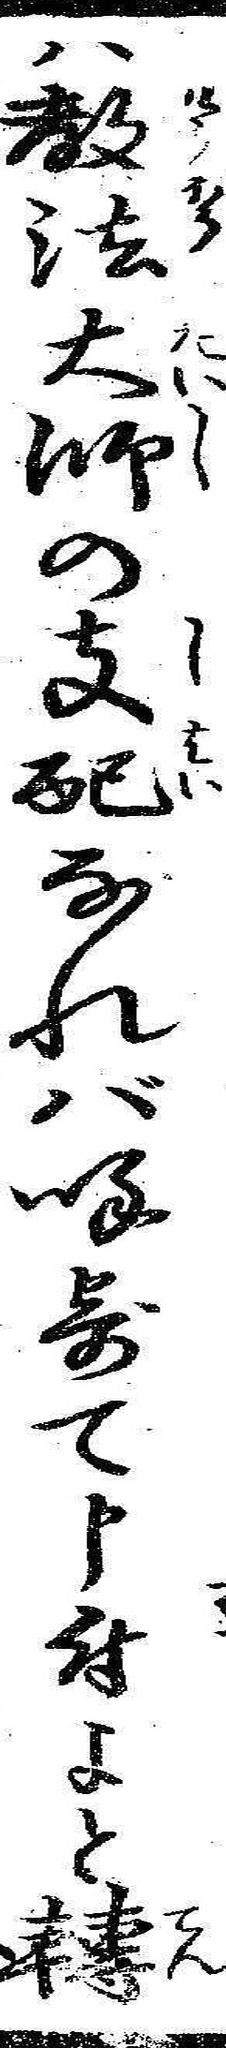は教法大師の支配なれば呼寄て申付よと転
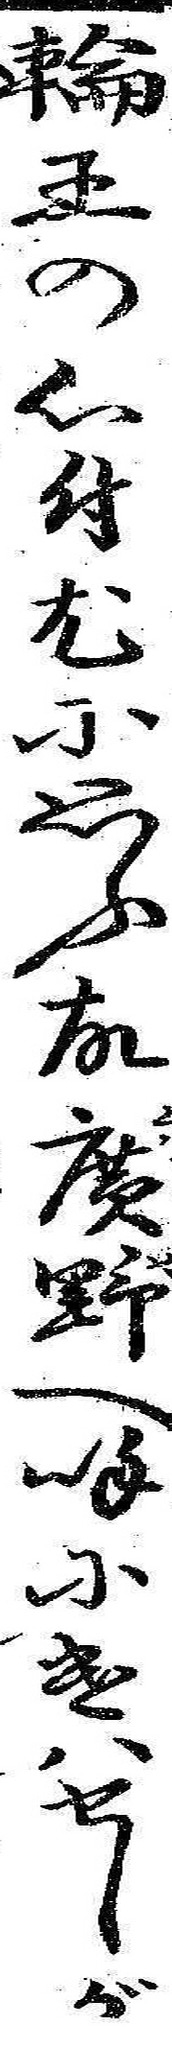輪王の心付尤に思ふ故広野へ呼に遣はせしが
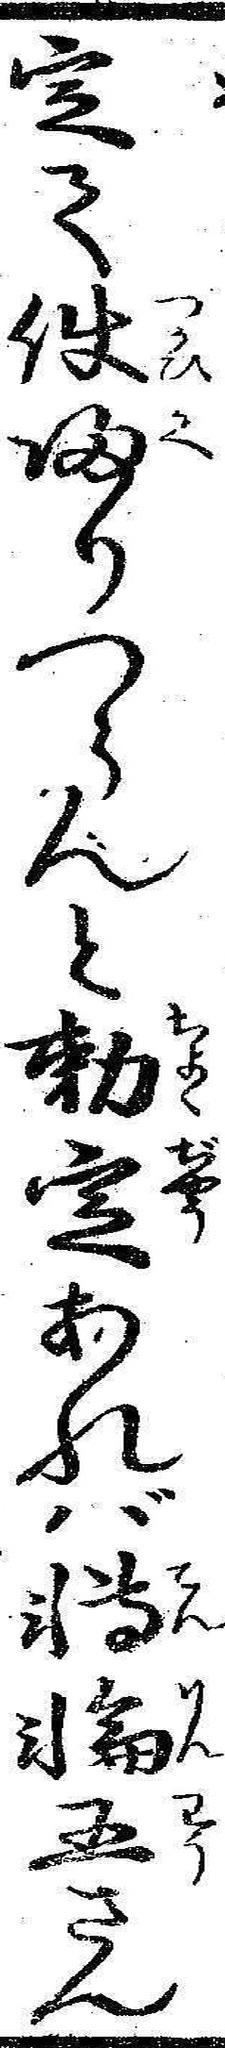定て使帰りつらんと勅定あれば転輪王さん
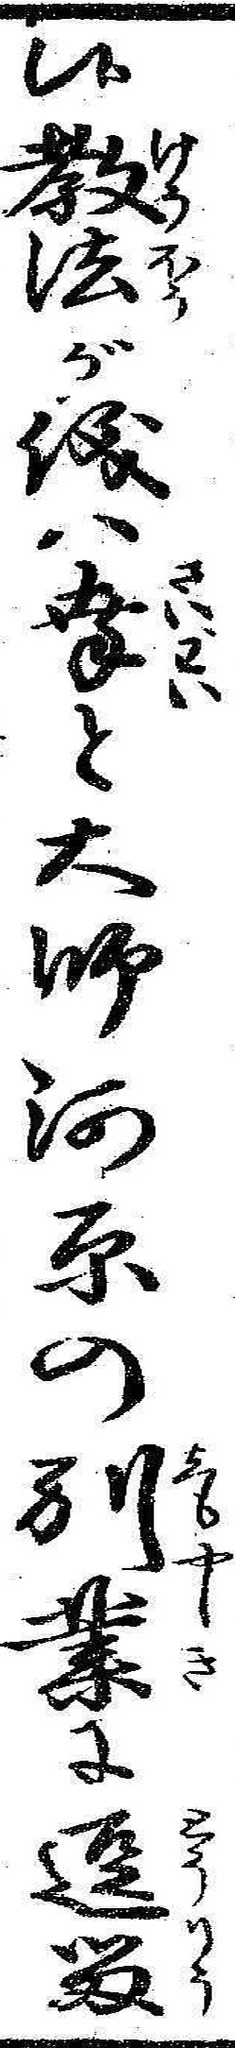候教法が儀は幸と大師河原の別業に逗留
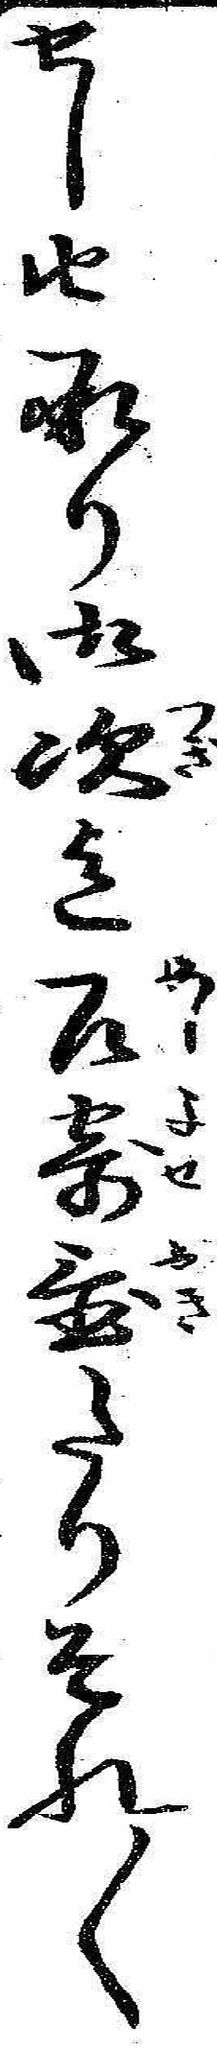せし由承り御次迄召寄置たりそれ〱
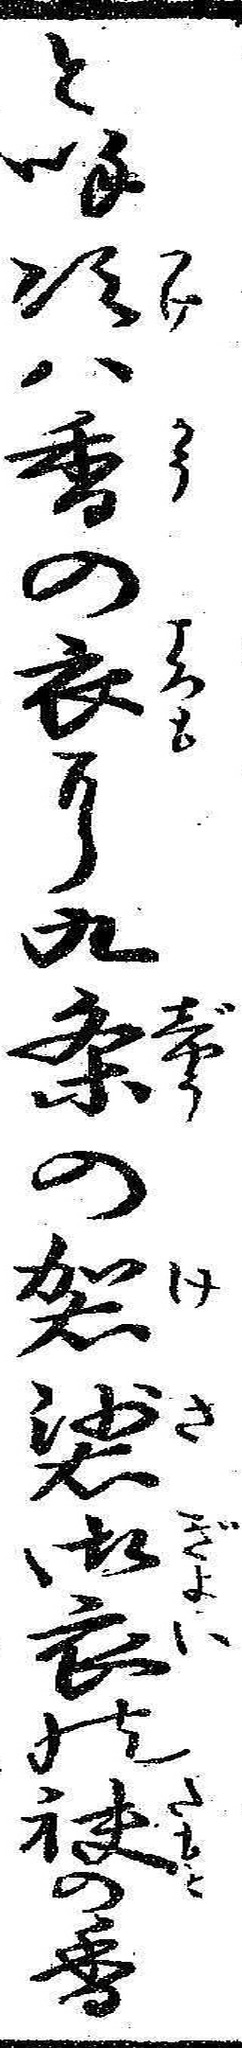と呼次は香の衣に九条の袈娑御衣の袂の香
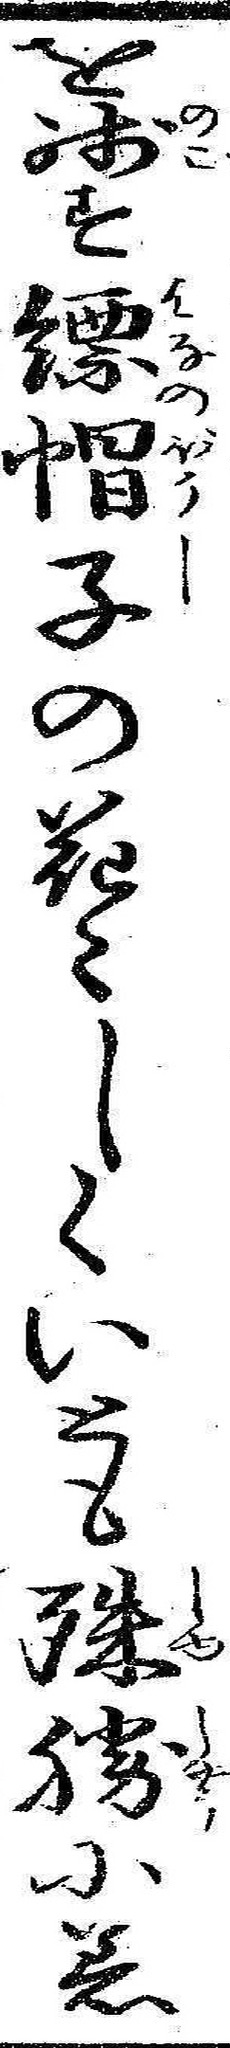を残す縹帽子の花々しくいとも殊勝に着
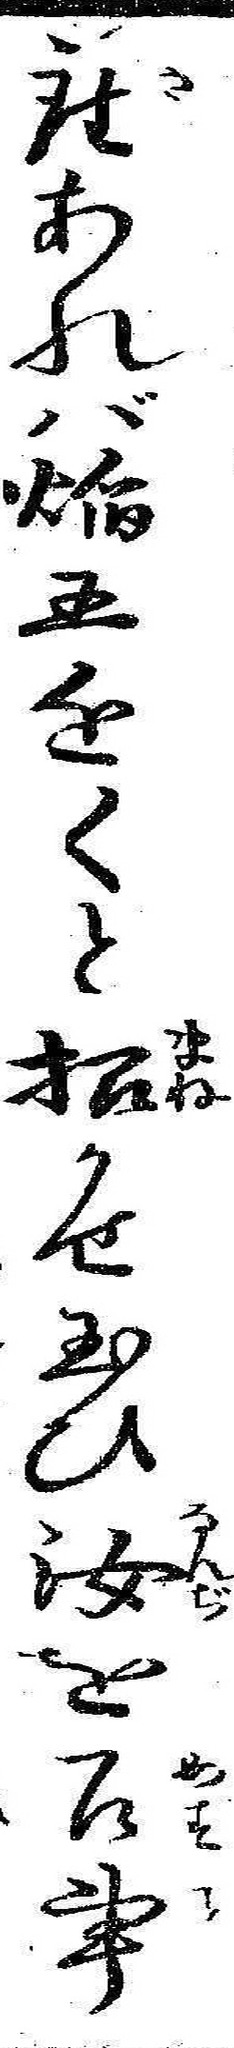座あれば焔王近くと招かせ玉ひ汝を召事
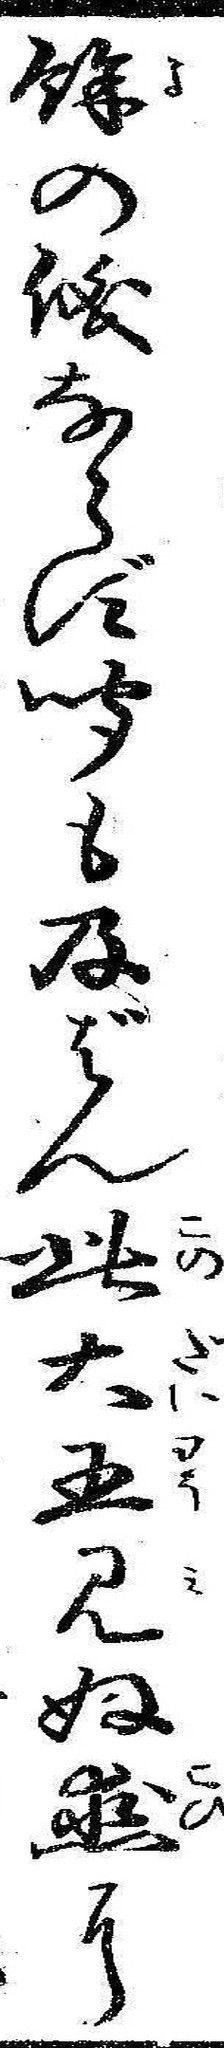余の儀ならず聞も及ばん此大王見ぬ恋に
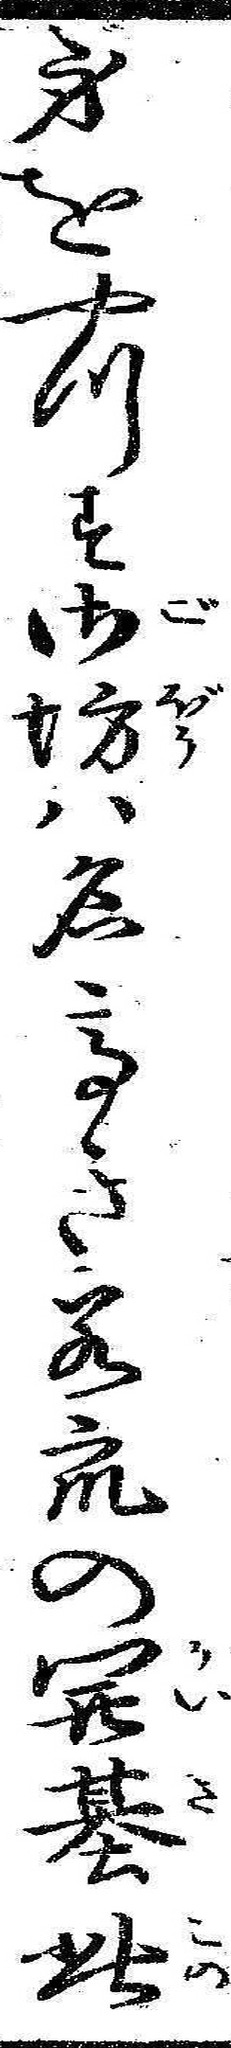身をやつす御坊は名高き若衆の開基此
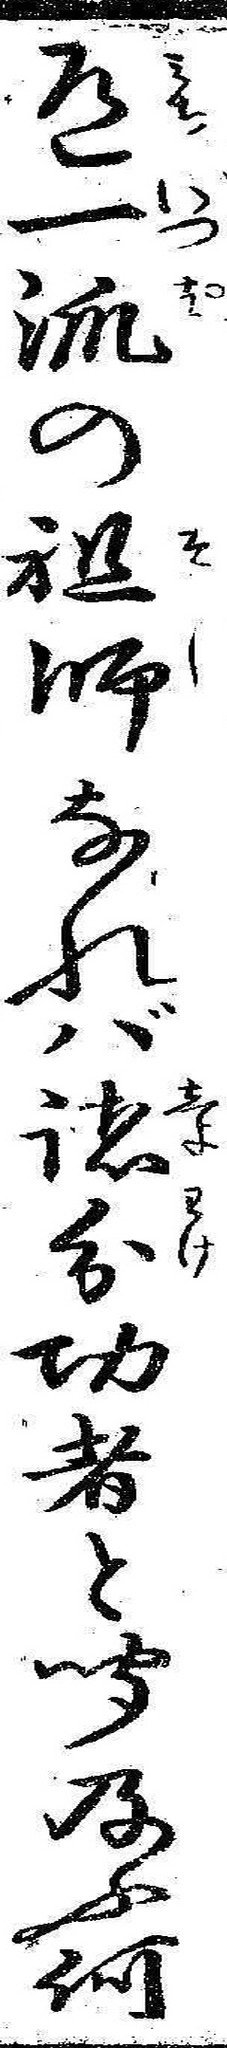道一派の祖師なれば諸分功者と聞及ふ何

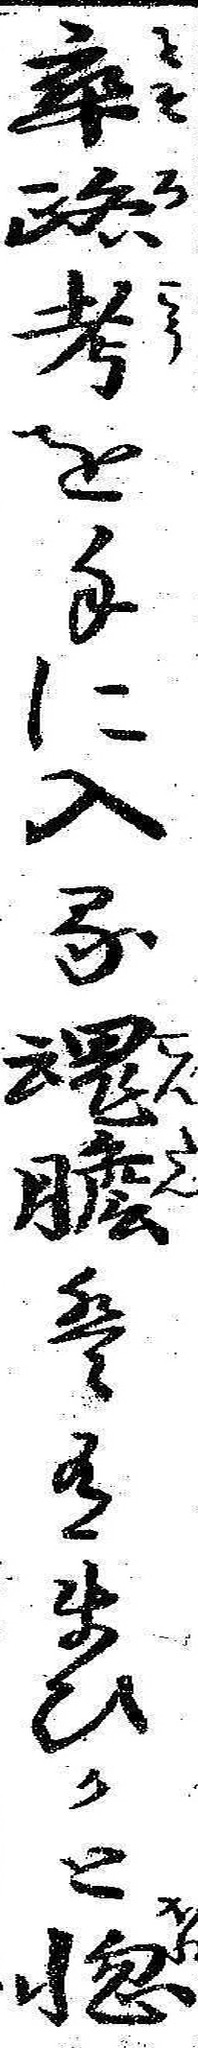卒路考を手に入る魂膽は有まひかと惚
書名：根無草後編
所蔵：国文学研究資料館
